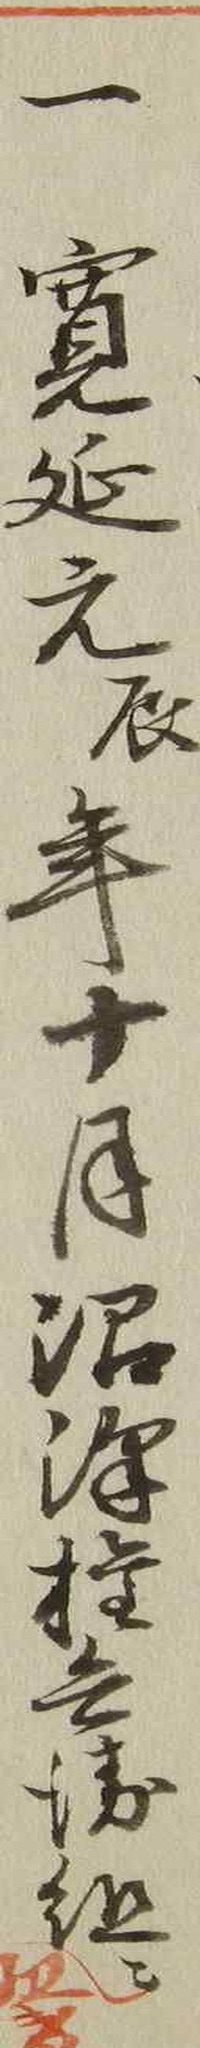一寛延元辰年十月沼沢権兵衛組ニ組替
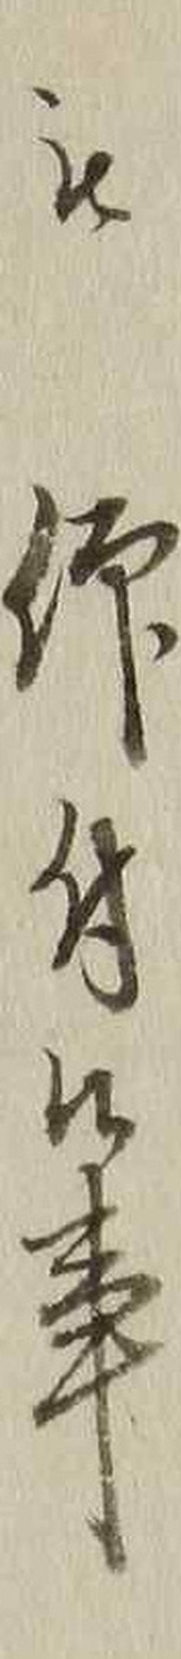被仰付候事
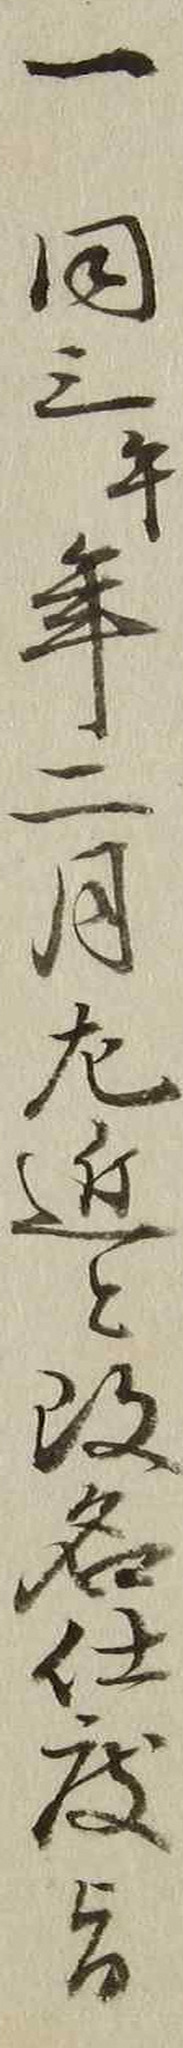一同三午年二月左近と改名仕度旨
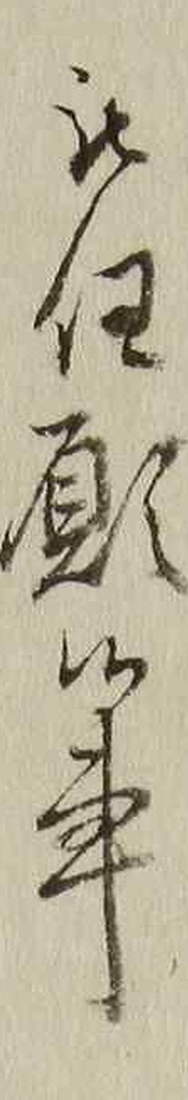被任願候事
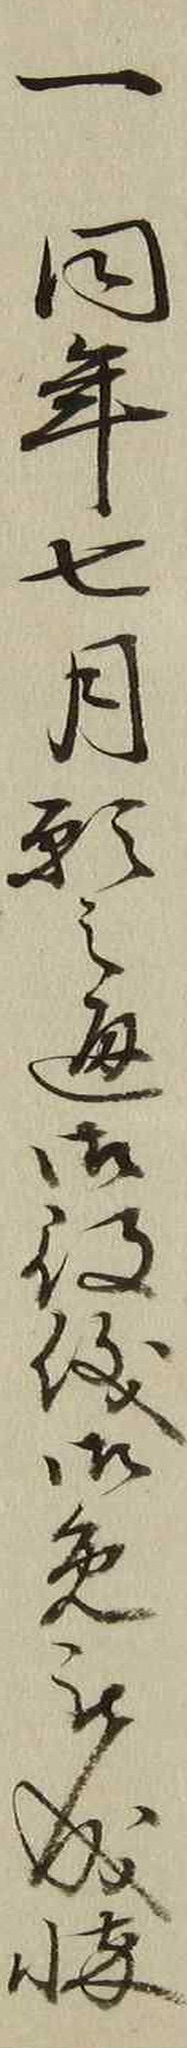一同年七月願之通御役儀御免被成悴
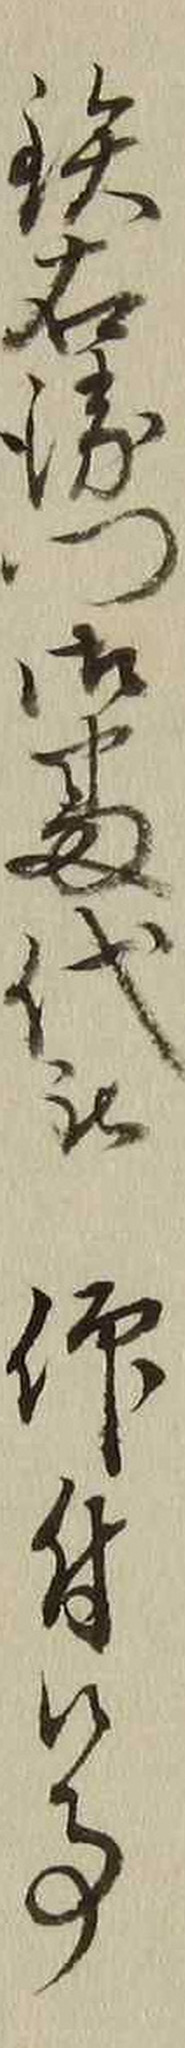鉄右衛門御番代被仰付候事
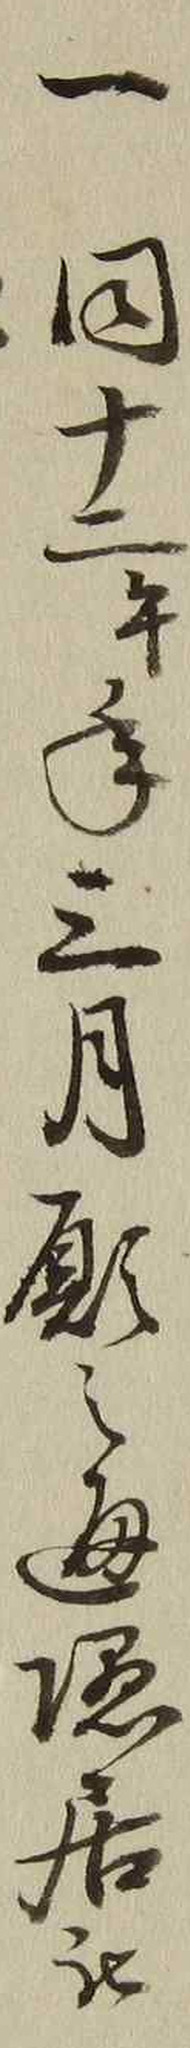一同十二午年三月願之通隠居被
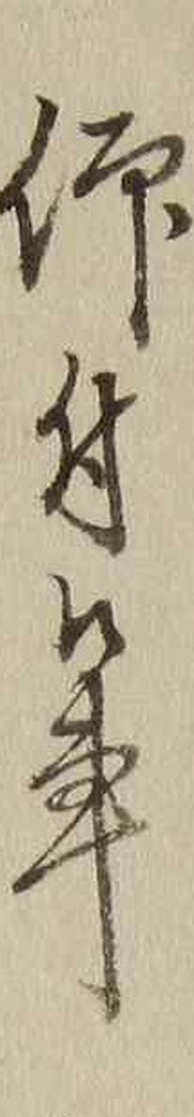仰付候事
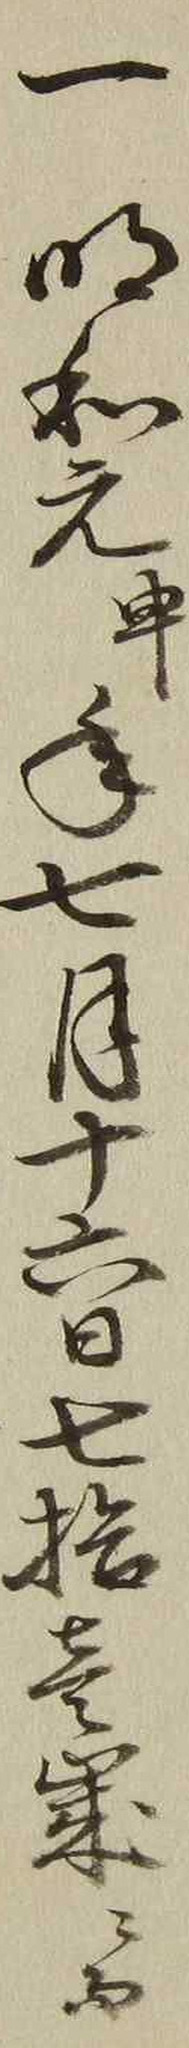一明和元申年七月十六日七拾壱歳ニ而
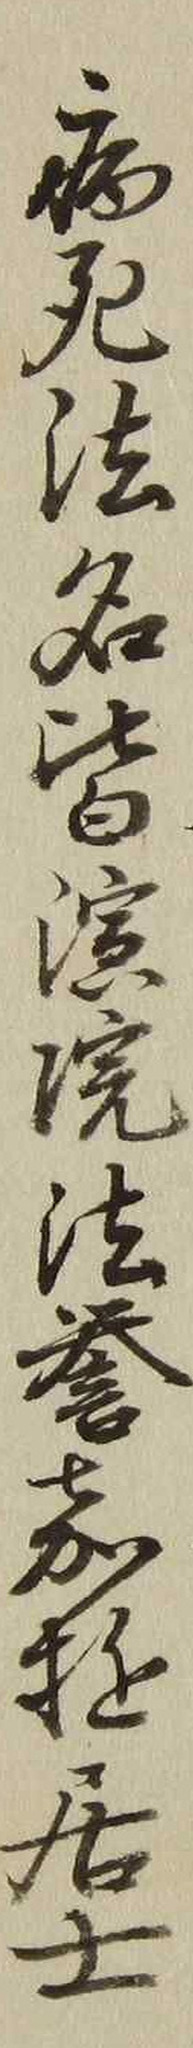病死法名皆演院法誉嘉遊居士
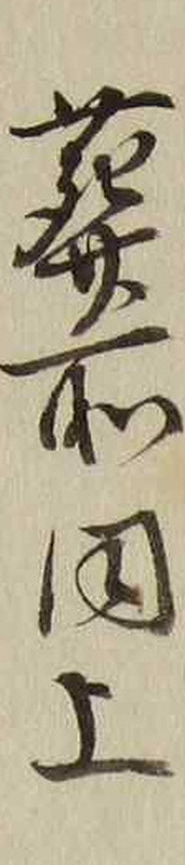葬所同上
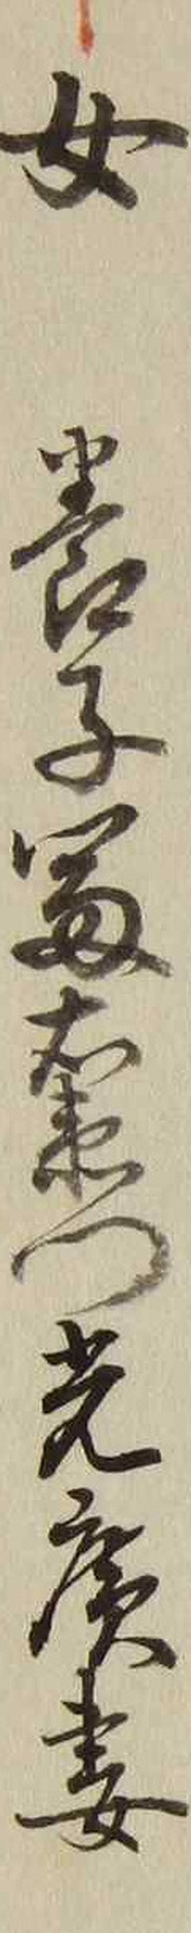女養子冨右衛門光広妻
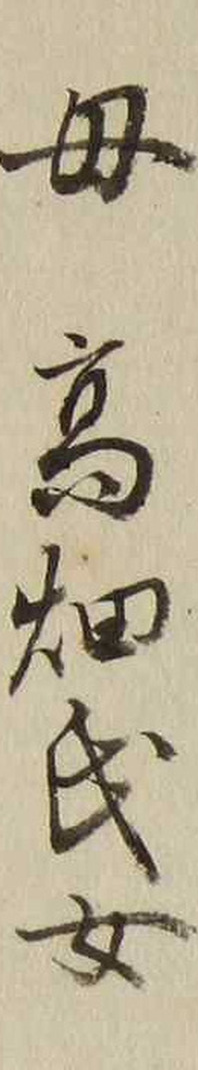母高畑氏女

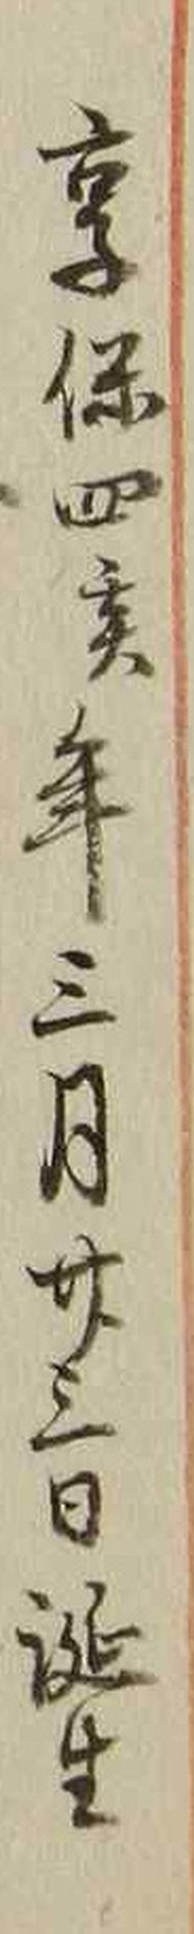享保四亥年三月廿三日誕生
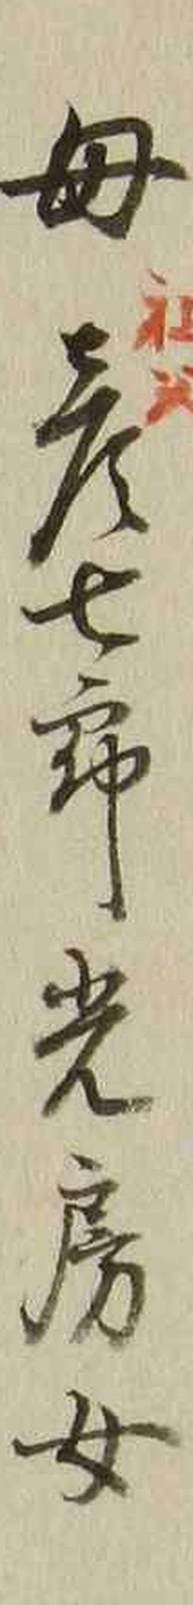母祖父彦七郎光房女
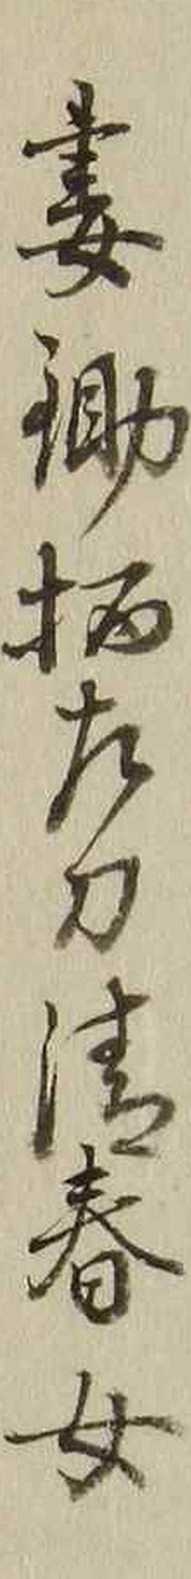妻鋤柄左刀清春女
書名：諸士系譜　巻之27　い之部27
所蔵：会津若松市立会津図書館
